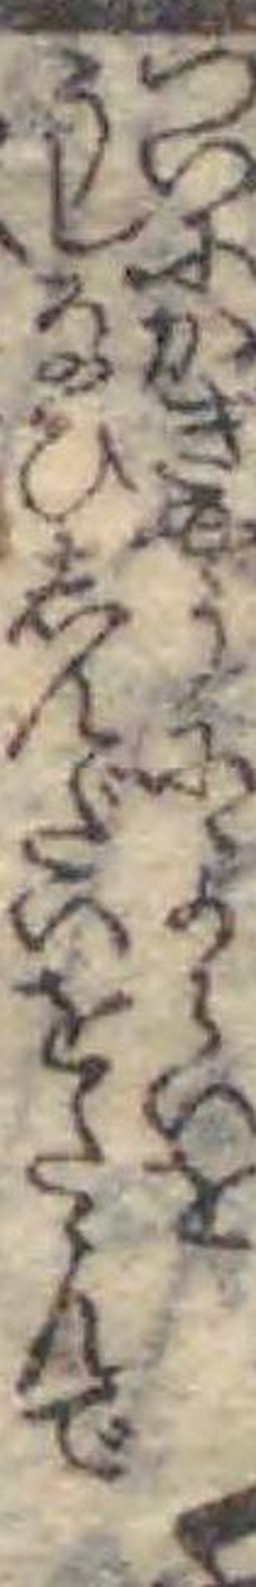うしなひしんだいをたゝんで
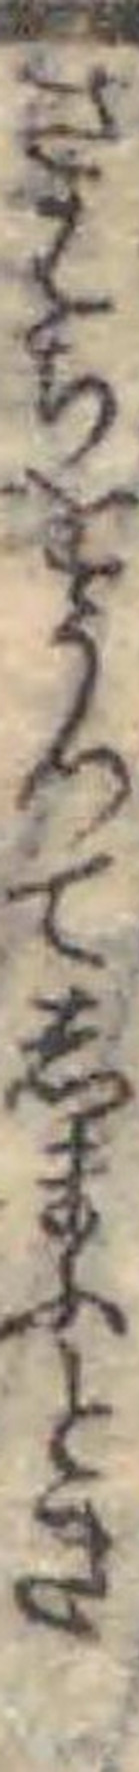さはちをうつてしまふとき
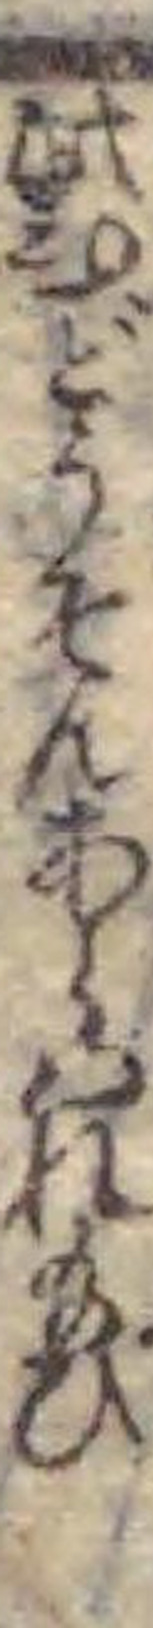此ひどうそんあらはれ給ひ
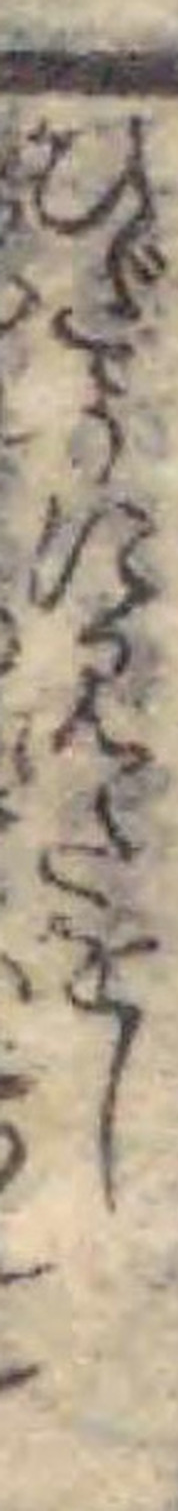ひだうに見たをし
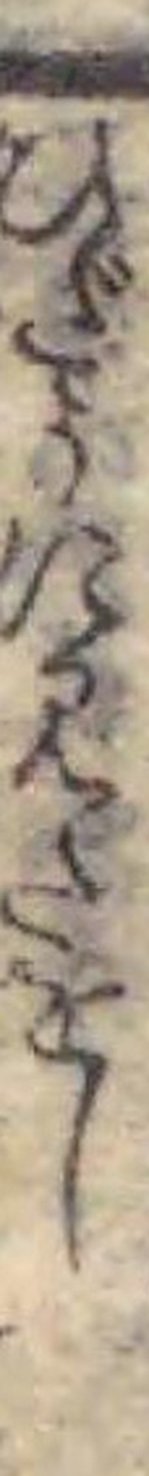ひだうに見たをし
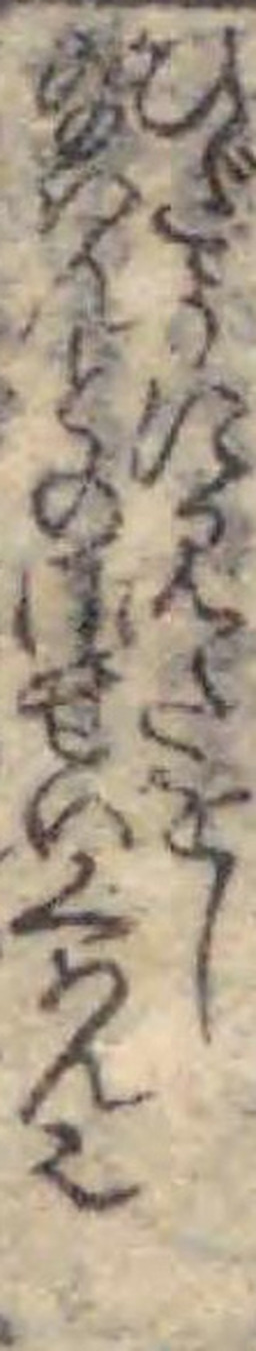給はんとの御せいくはん也
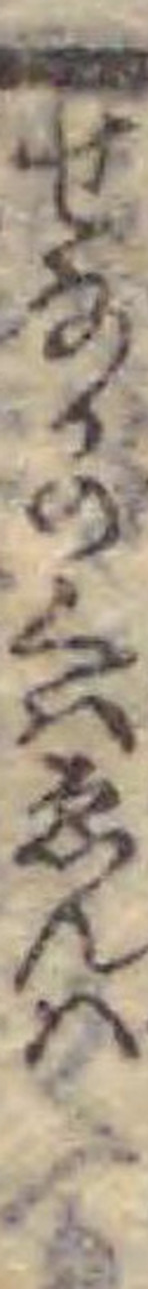せなかのくはゑんは
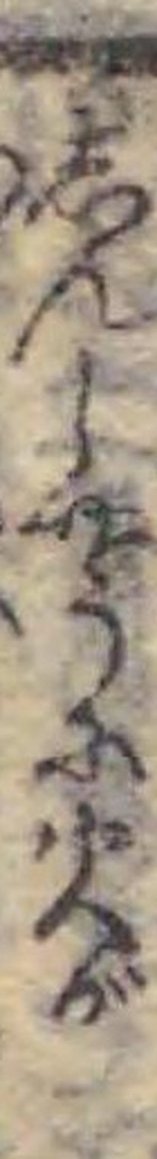しんしやうに火が
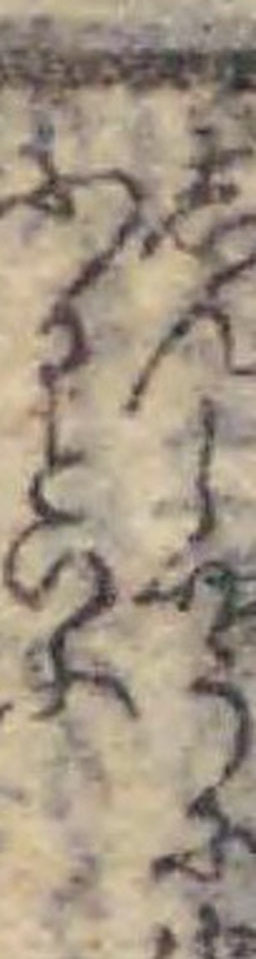ふるといふ
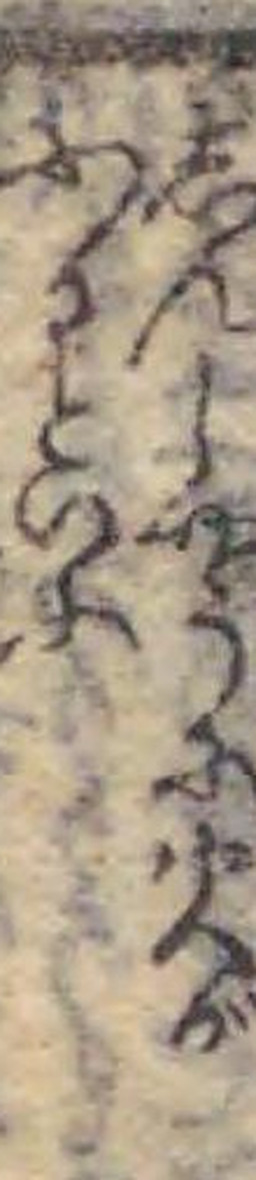ふるといふ
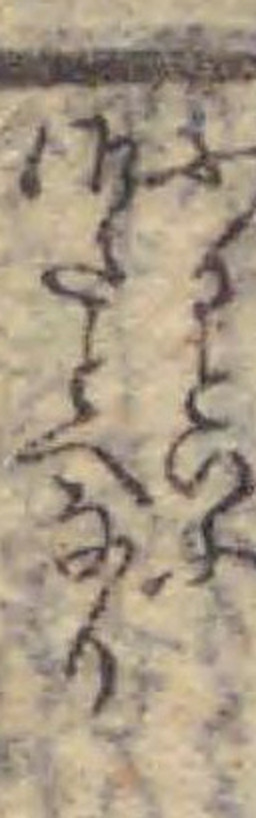御たとへなり
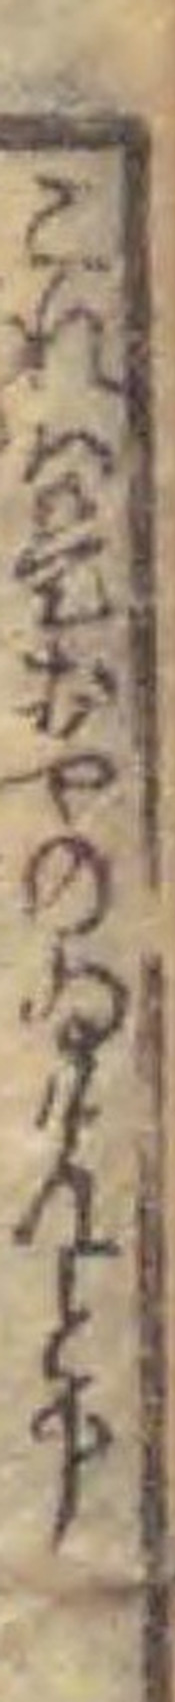これは是おやのゐけんと申
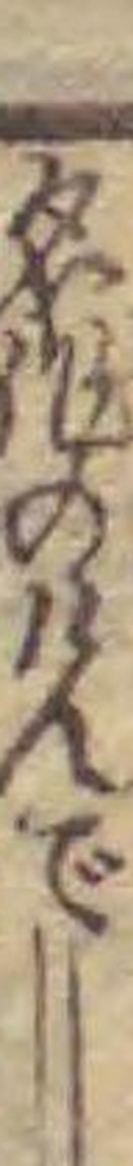名作のけんで
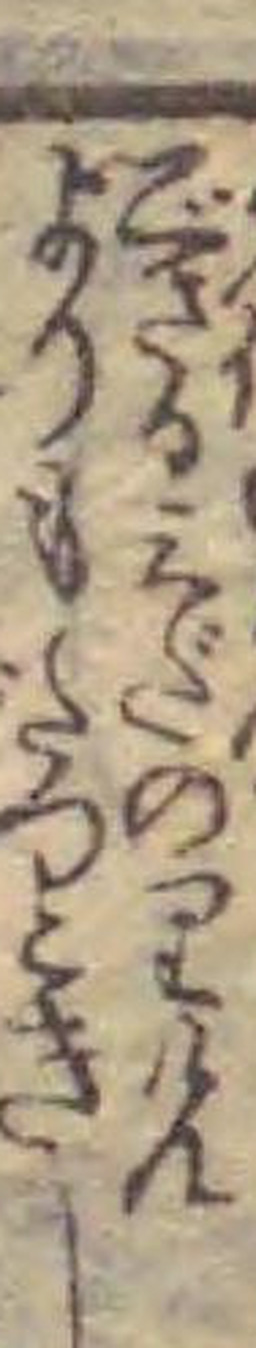よりもたつとき
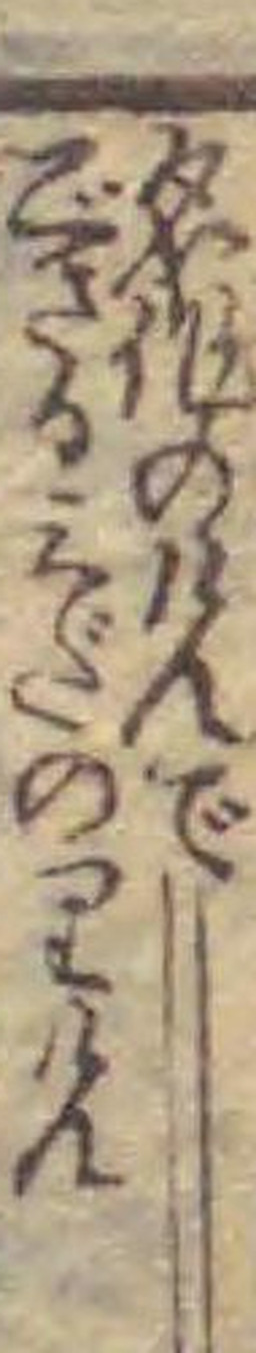ごさるみだのりけん
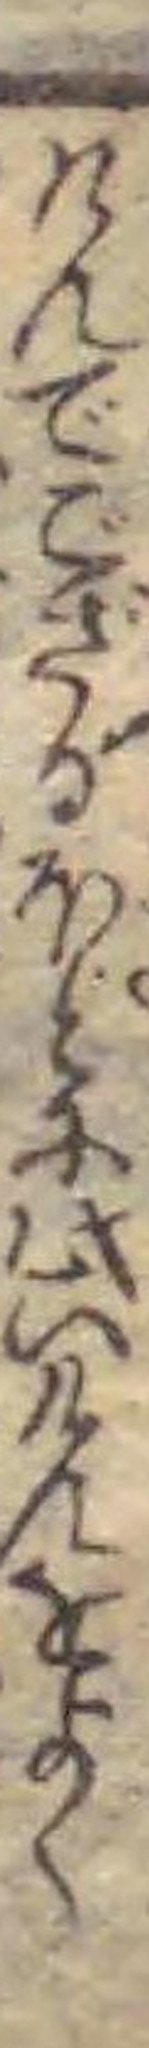けんでござるほどに此いけんをよく
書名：身体開帳略縁起 : 3巻
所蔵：国立国会図書館 National Diet Library, JAPAN
